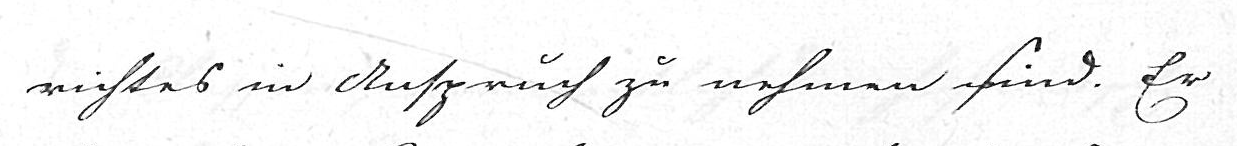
richtes in Anspruch zu nehmen sind. Er
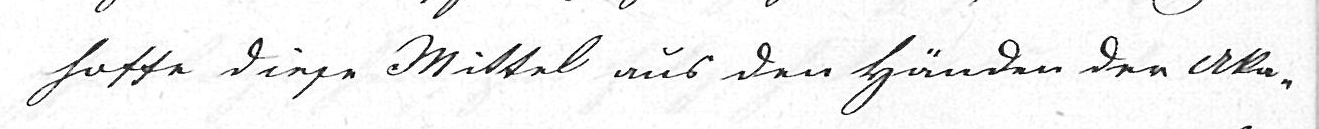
hoffe diese Mittel aus den Händen der Aka-
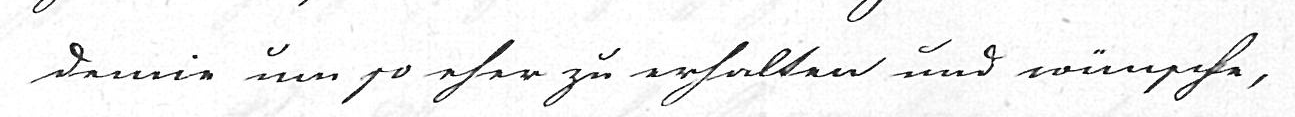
demie um so eher zu erhalten und wünsche
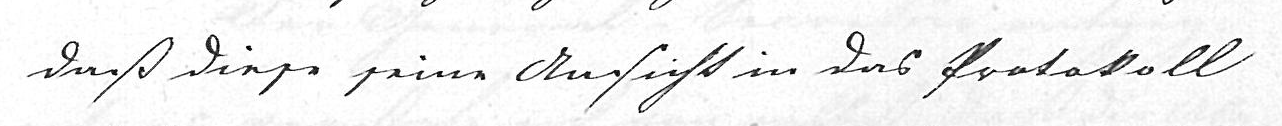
daß diese seine Ansicht in das Protokoll
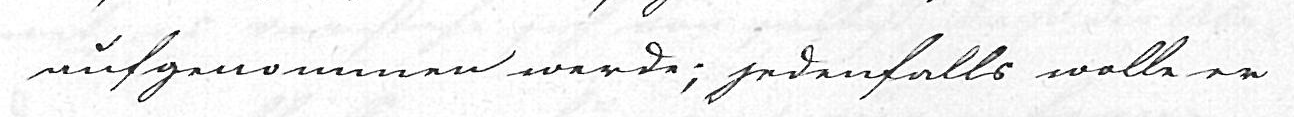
aufgenommen werde; jedenfalls wolle er
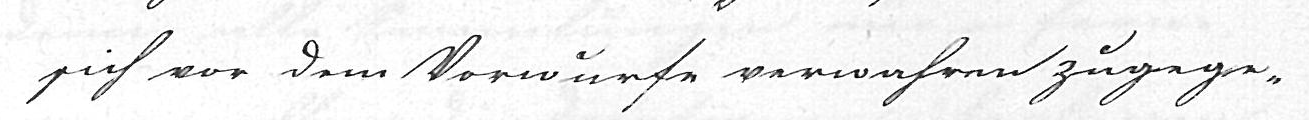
sich vor dem Vorwurfe verwahren zugege-
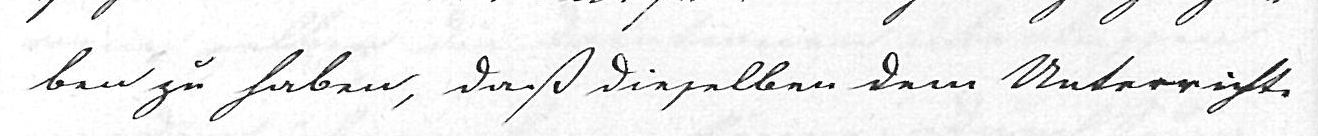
ben zu haben, daß dieselben dem Unterrichte
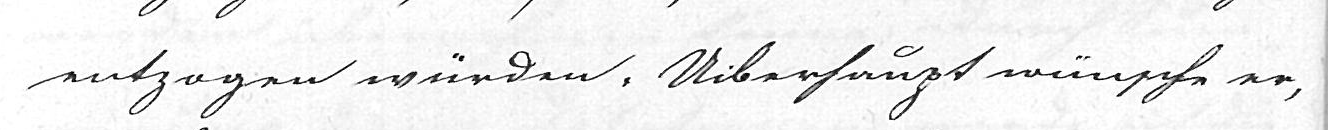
entzogen würden. Uiberhaupt wünsche er,
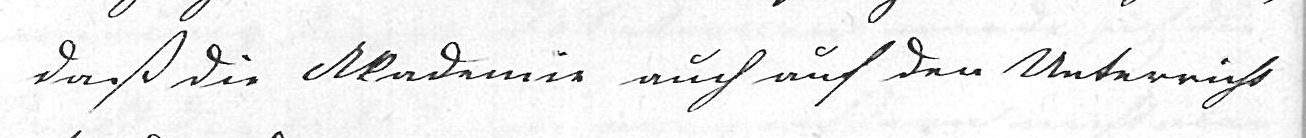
daß die Akademie auch auf den Unterricht
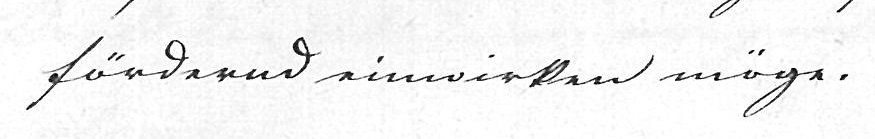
fördernd einwirken möge.
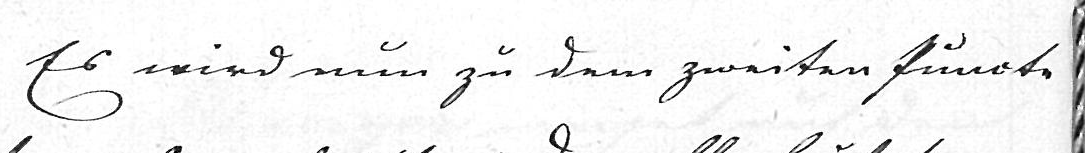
Er wird nun zu dem zweiten Puncte
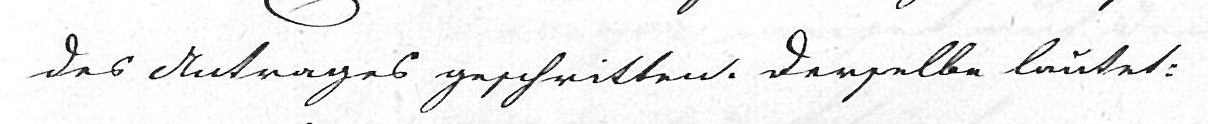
des Antrages geschritten. Derselbe lautet:
